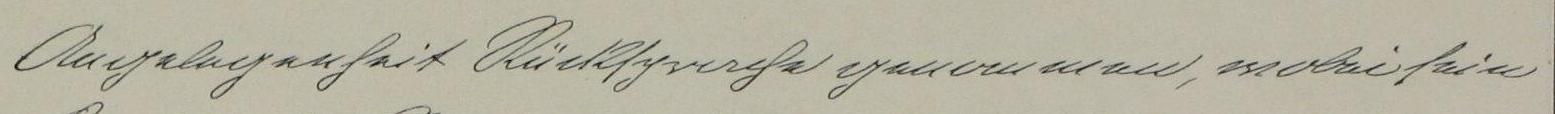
Angelegenheit Rücksprache genommen, wobei sein
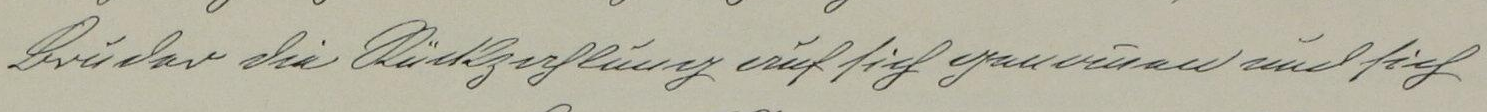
Bruder die Rückzahlung auf sich genommen und sich
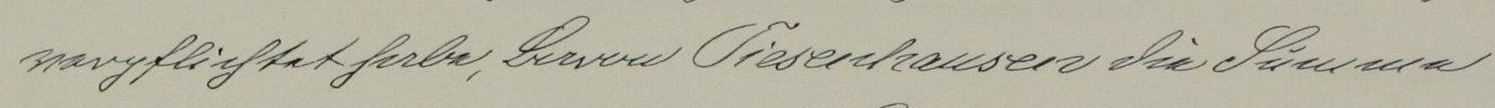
verpflichtet habe, Baron Tiesenhausen die Summe
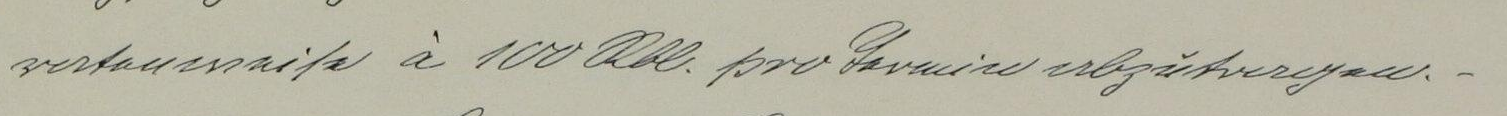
ratenweise à 100 Rbl. pro Termin abzutragen. -
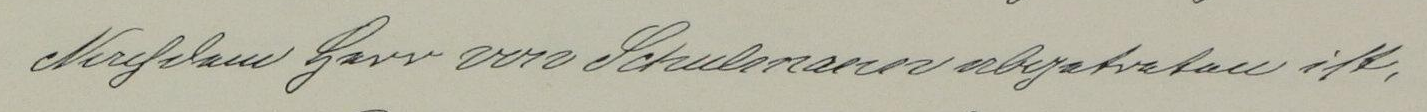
Nachdem Herr von Schulmann abgetreten ist,
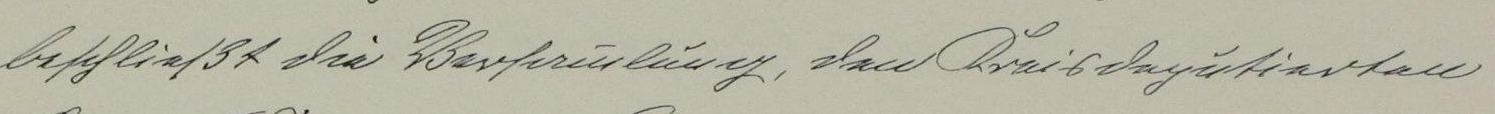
beschließt die Versammlung, den Kreisdeputierten
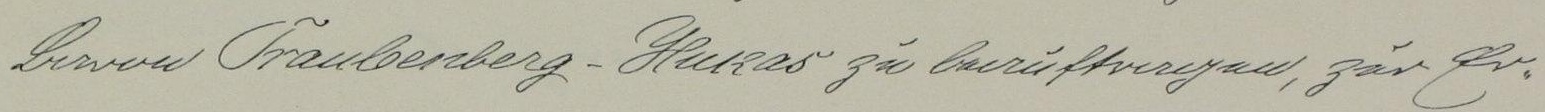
Baron Traubenberg-Hukas zu beauftragen, zur Er-
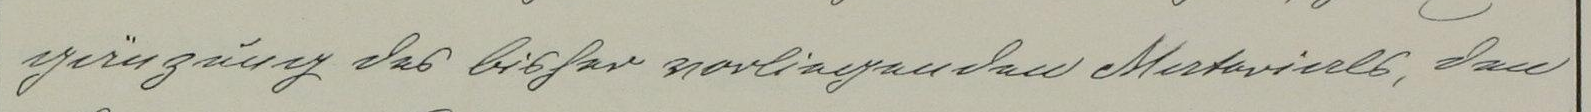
gänzung des bisher vorliegenden Materials, den
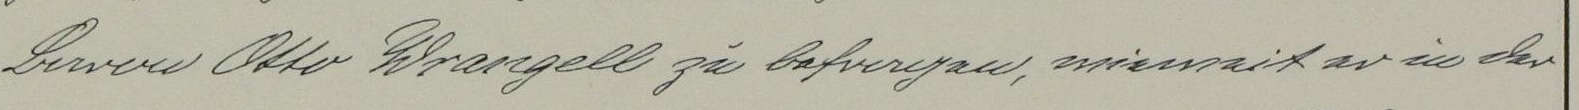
Baron Otto Wrangell zu befragen, wieweit er in der
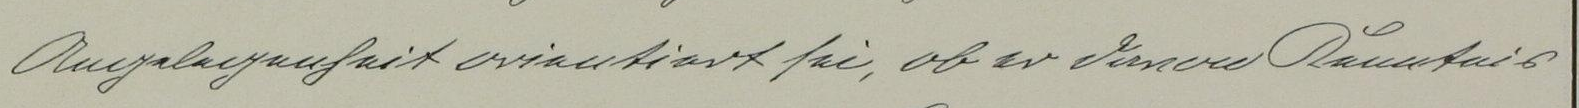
Angelegenheit orientiert sei, ob er davon Kenntnis
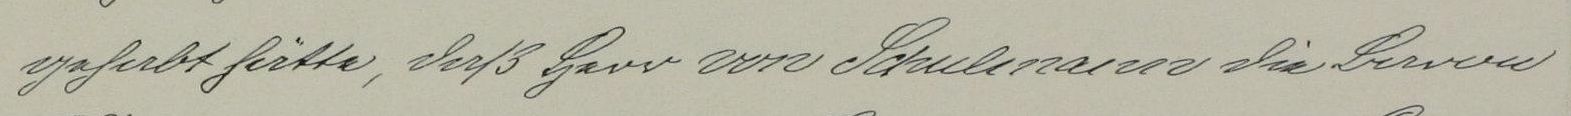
gehabt hätte, daß Herr von Schulmann die Baron
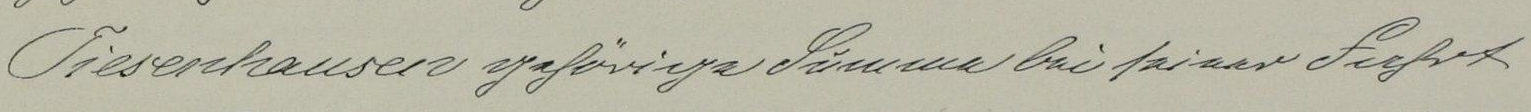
Tiesenhausen gehörige Summe bei seiner Fahrt
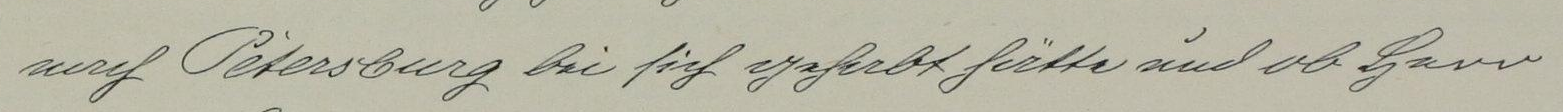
nach Petersburg bei sich gehabt hätte und ob Herr
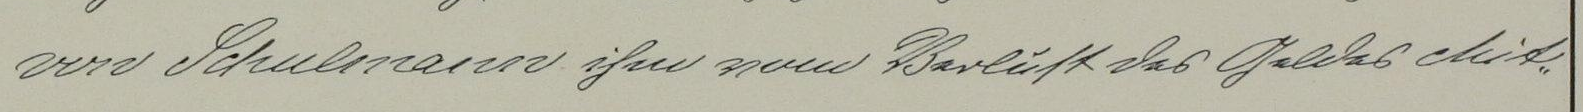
von Schulmann ihm vom Verlust des Geldes Mit-
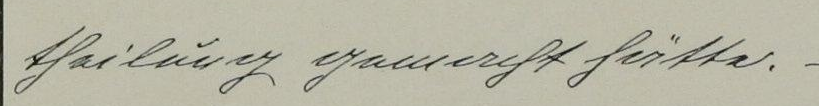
theilung gemacht hätte.
